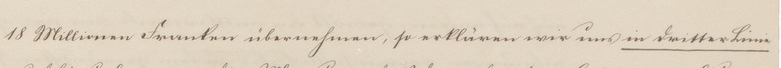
18 Millionen Franken übernehmen, so erklären wir uns in dritter Linie
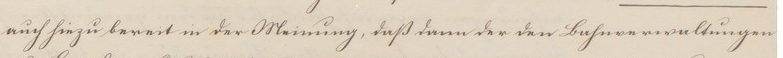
auch hiezu bereit in der Meinung, daß dann der den Bahnverwaltungen
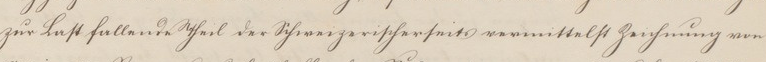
zur Last fallende Theil der Schweizerischerseits vermittelst Zeichnung von
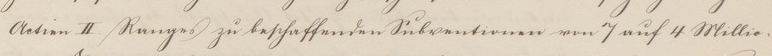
Actien II. Ranges zu beschaffenden Subventionen von 7 auf 4 Millio-
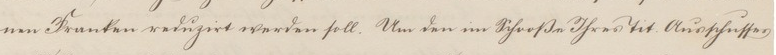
nen Franken reduzirt werden soll. Um den im Schooße Ihres Tit. Ausschusses
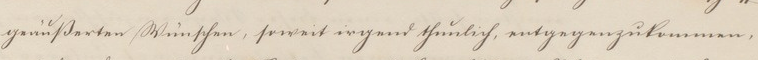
geäußerten Wünschen, soweit irgend thunlich, entgegenzukommen,
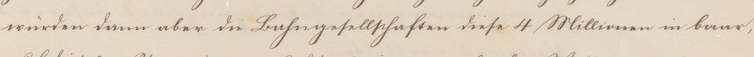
würden dann aber die Bahngesellschaften diese 4 Millionen in baar,
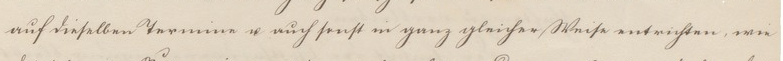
auf dieselben Termine & auch sonst in ganz gleicher Weise entrichten, wie
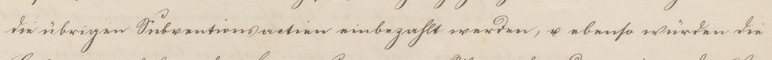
die übrigen Subventionsactien einbezahlt werden, & ebenso würden die
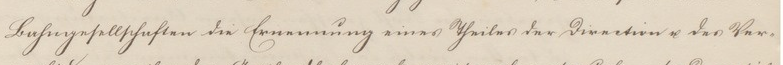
Bahngesellschaften die Ernennung eines Theiles der Direction & des Ver-
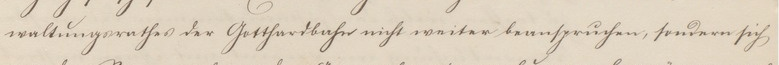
waltungsrathes der Gotthardbahn nicht weiter beanspruchen, sondern sich
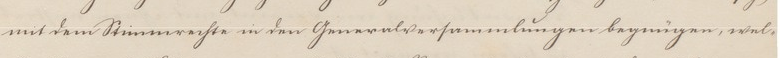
mit dem Stimmrechte in den Generalversammlungen begnügen, wel-
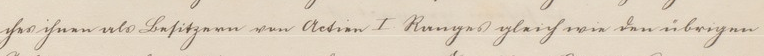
ches ihnen als Besitzern von Actien I. Ranges gleich wie den übrigen
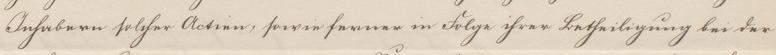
Inhabern solcher Actien, sowie ferner in Folge ihrer Betheiligung bei der
